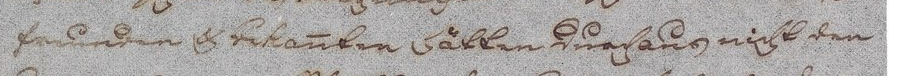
Freunden & Bekannten hätten durchaus nicht den
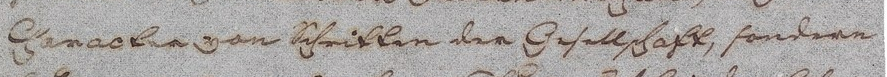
Character von Schritten der Gesellschaft, sondern
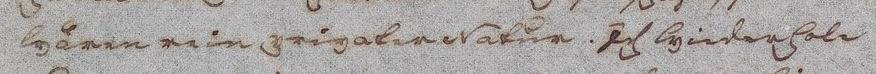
wären rein privater Natur. Ich wiederhole
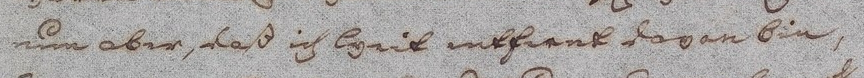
nun aber, daß ich weit entfernt davon bin,
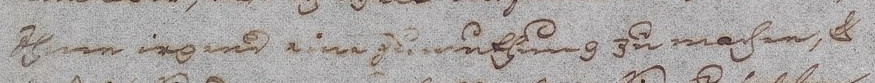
Ihnen irgend eine Zumuthung zu machen, &
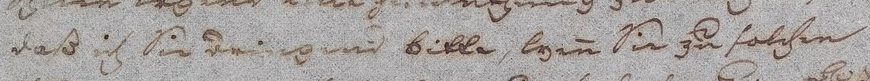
daß ich Sie dringend bitte, wenn Sie zu solchen
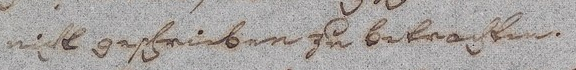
nicht geschrieben zu betrachten.
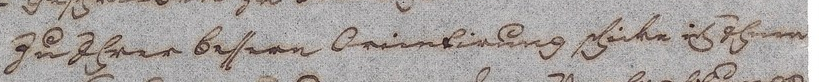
Zu ihrer bessern Orientirung schicke ich Ihnen
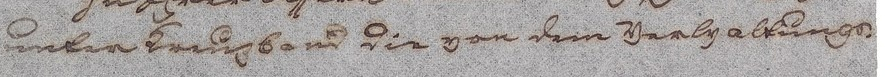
unter Kreuzband die von dem Verwaltungs-
